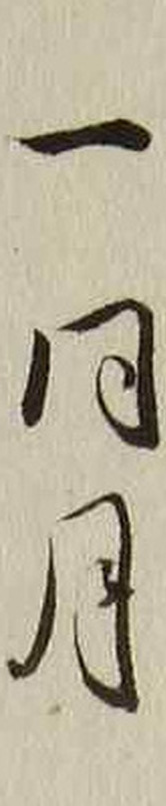一同月
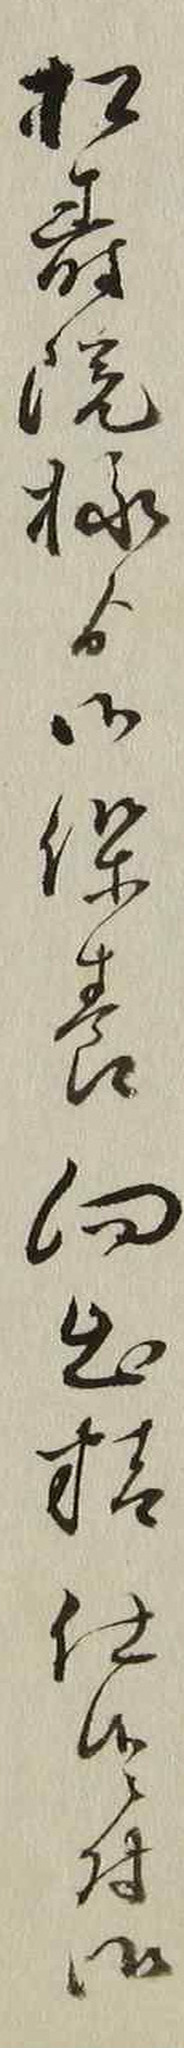松寿院様より御保養向出精仕候ニ付御
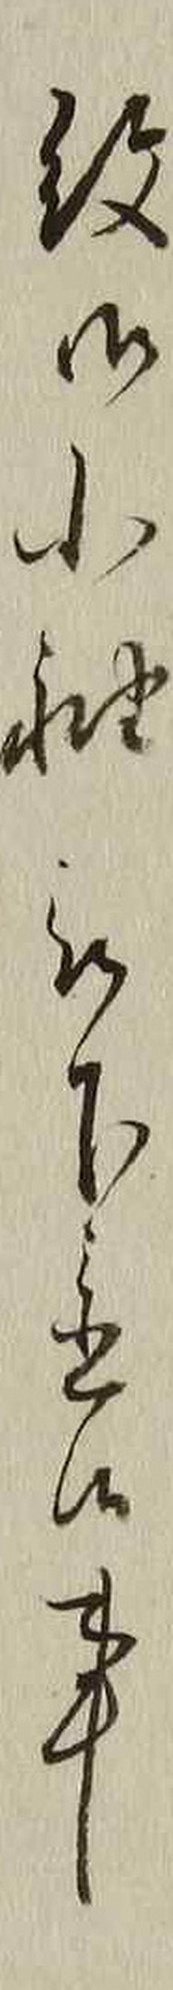紋御小袖被下置候事
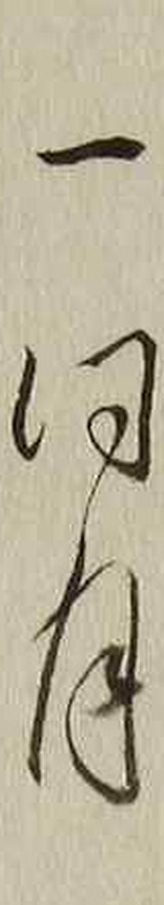一同月
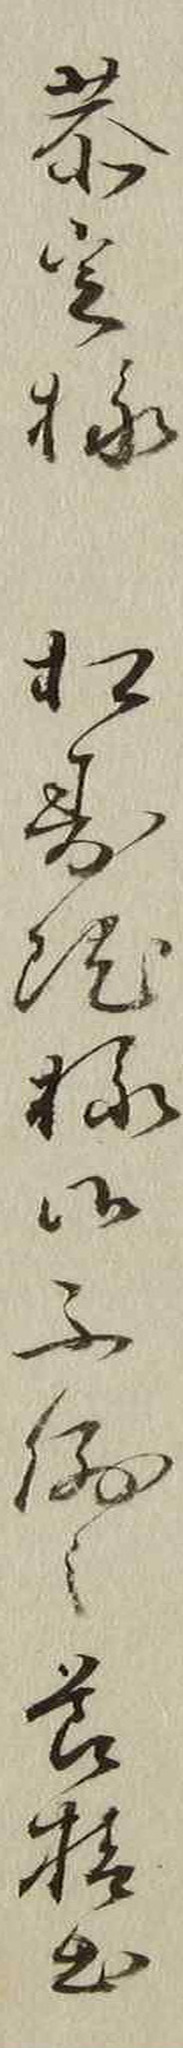恭定様松寿院様御不例之節精出
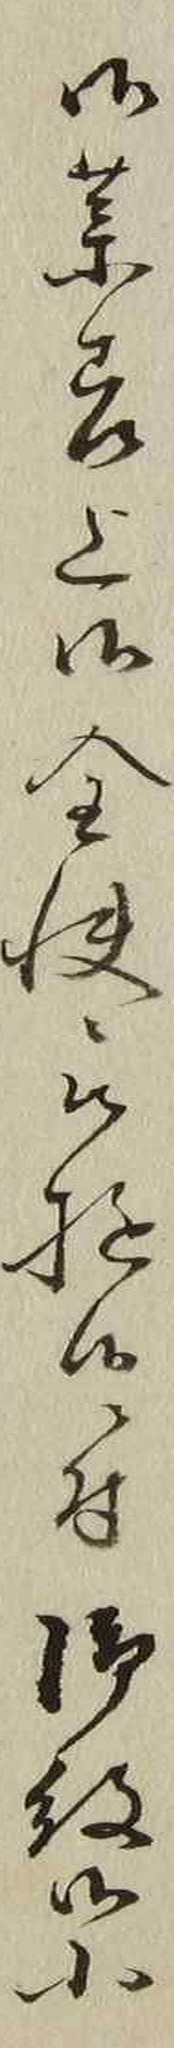御薬差上御全快被遊候ニ付御紋御小
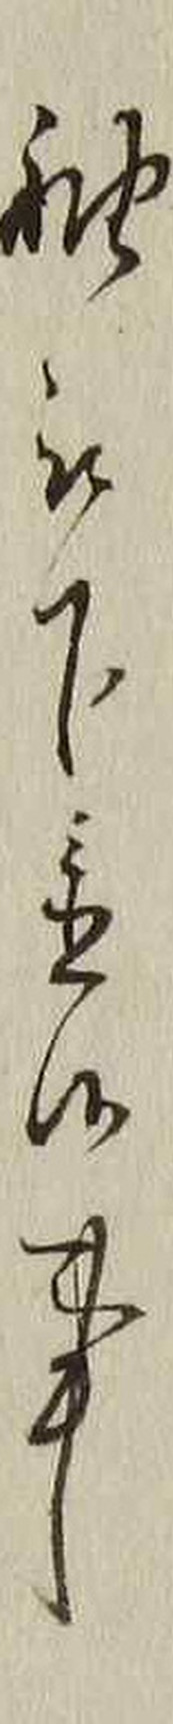袖被下置候事
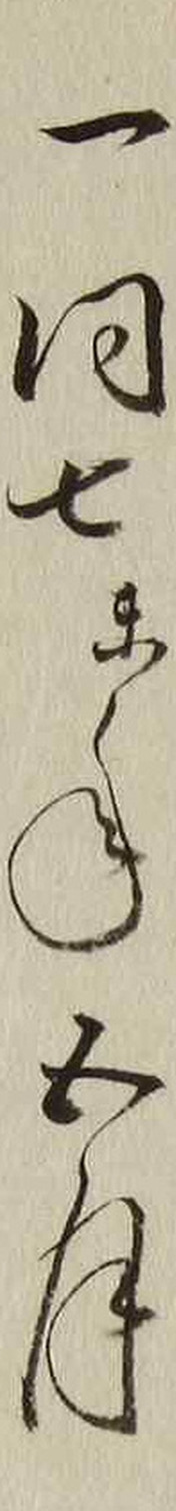一同七未年五月
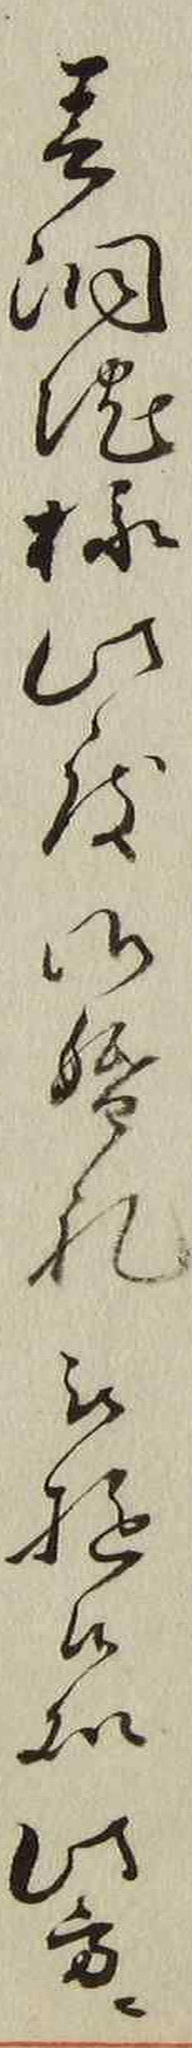春洞院様此度御婚礼被遊候処此方ニ
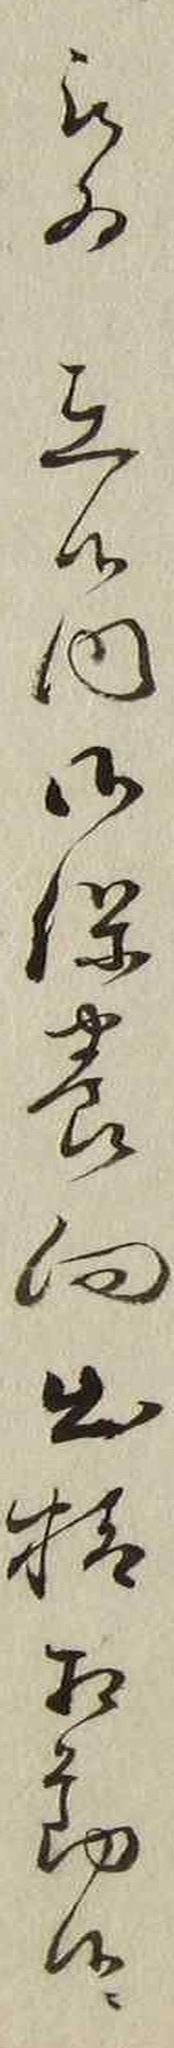被為在候内御保養向出精相勤候ニ
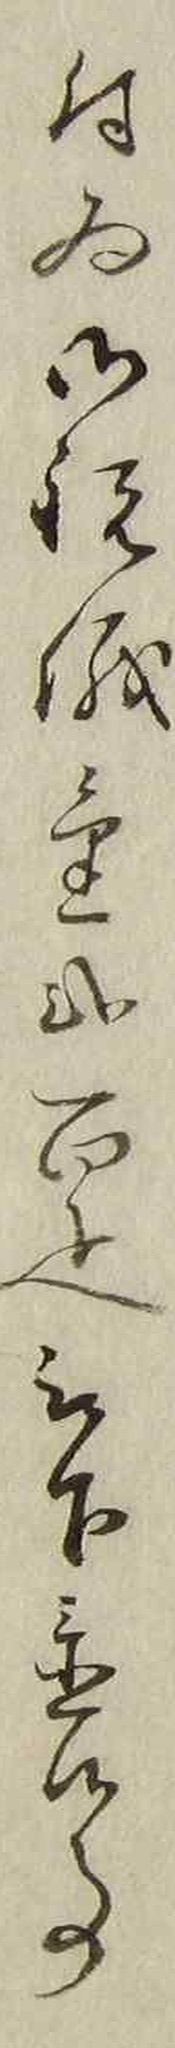付為御祝儀金弐百疋被下置候事
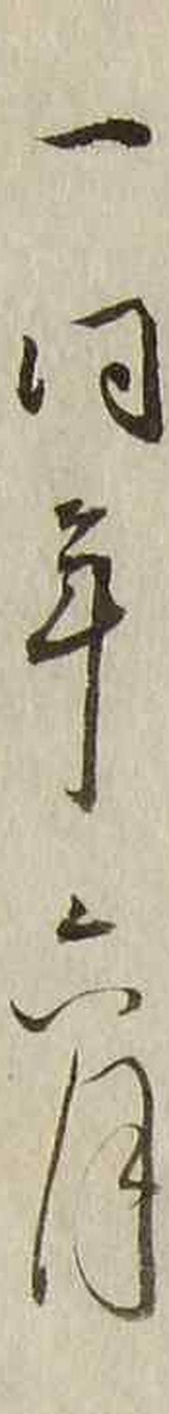一同年六月

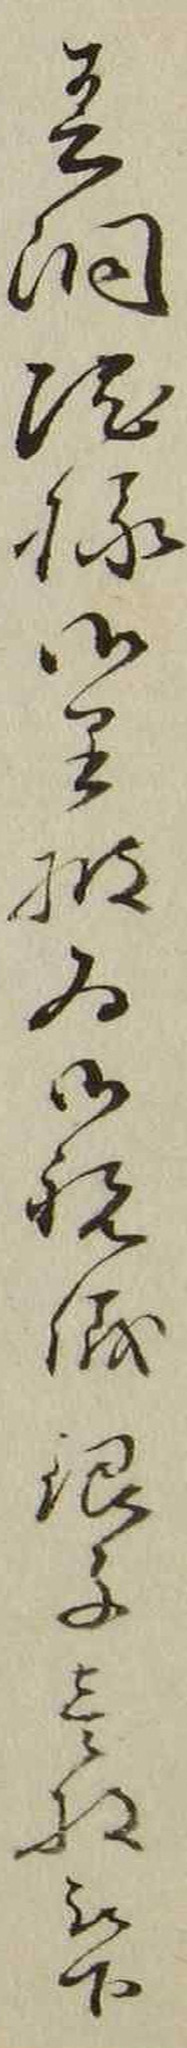春洞院様御里披為御祝儀銀子壱枚被下
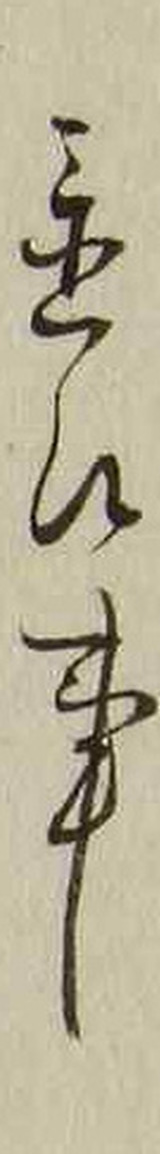置候事
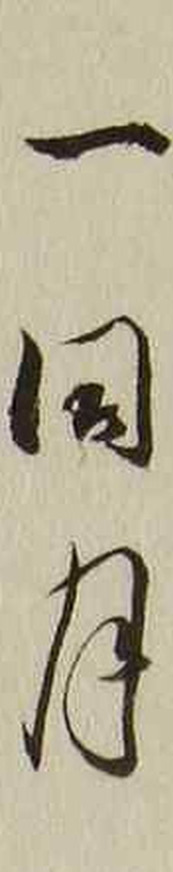一同月
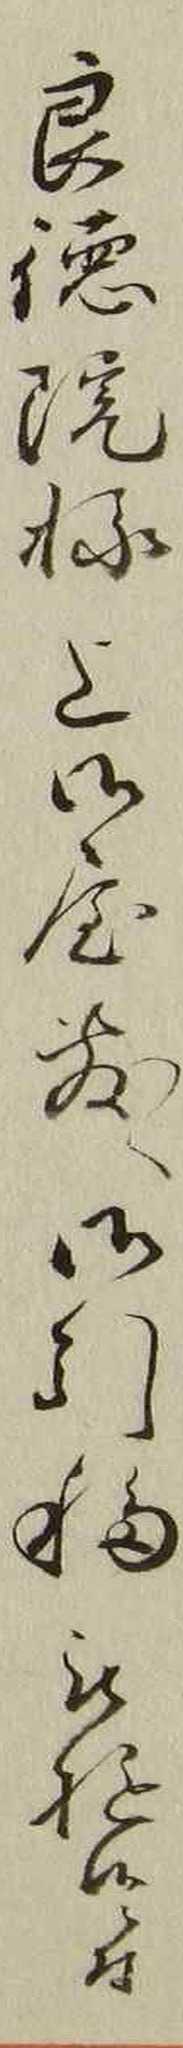良徳院様上屋敷へ御引移被遊候ニ付
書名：諸士系譜　巻之8　い之部8
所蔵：会津若松市立会津図書館
